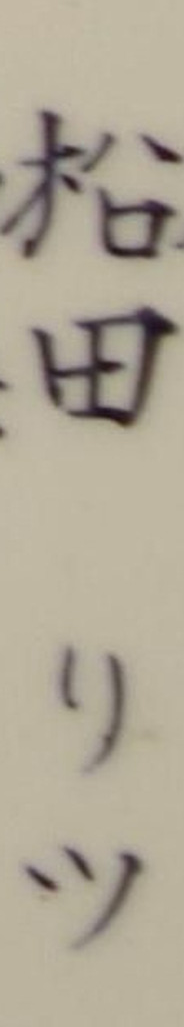松田リツ
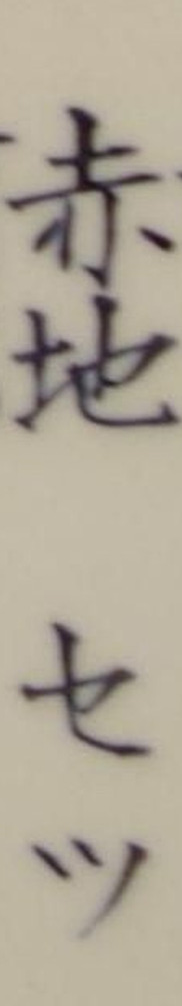赤地セツ
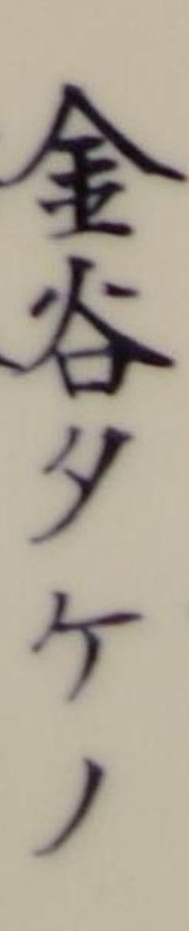金谷タケノ
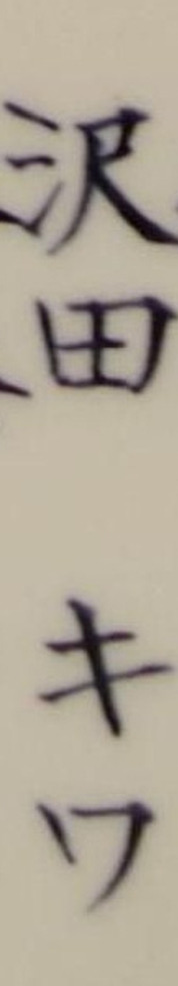沢田キワ
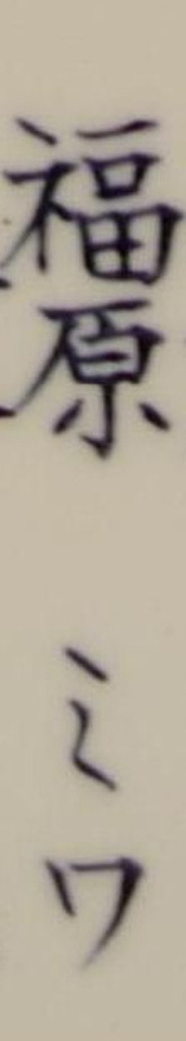福原ミワ
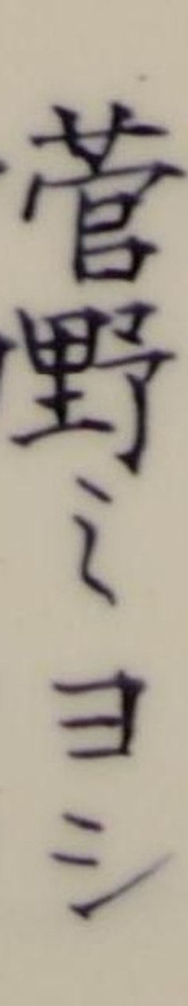菅野ミヨシ
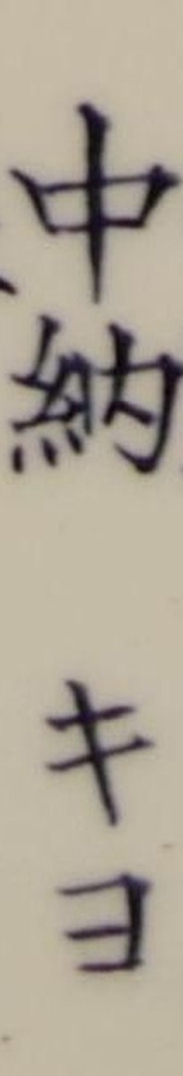中納キヨ
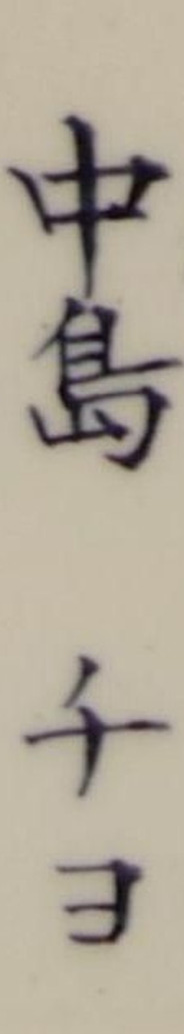中島チヨ
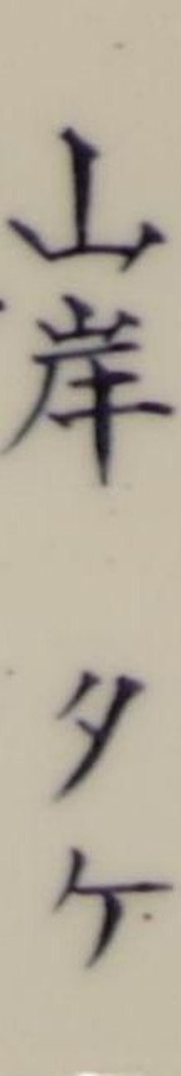山岸タケ
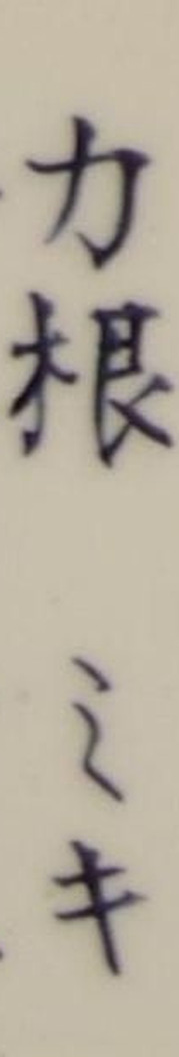力根ミキ
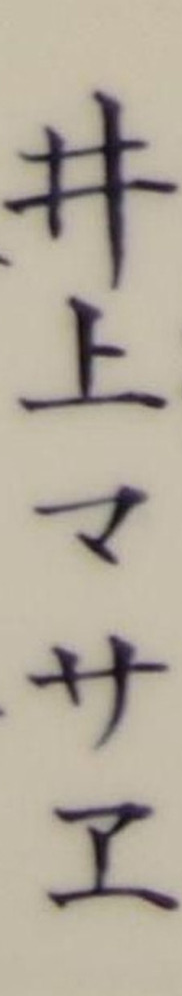井上マサヱ
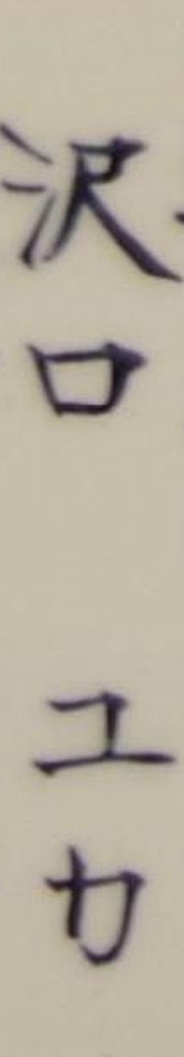沢口ユカ
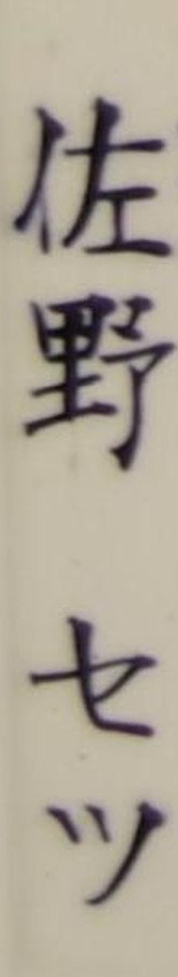佐野セツ

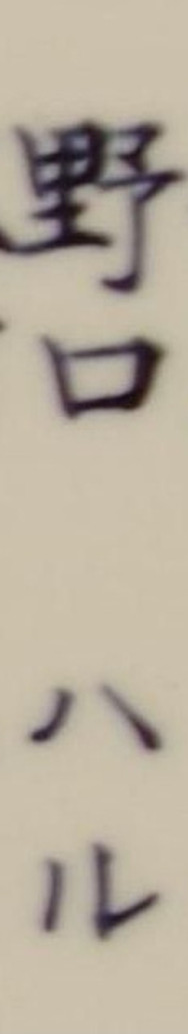野口ハル
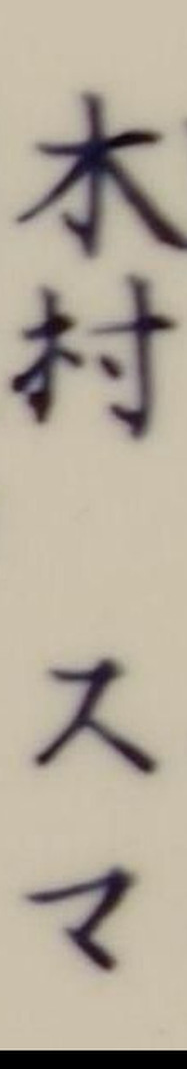木村スマ
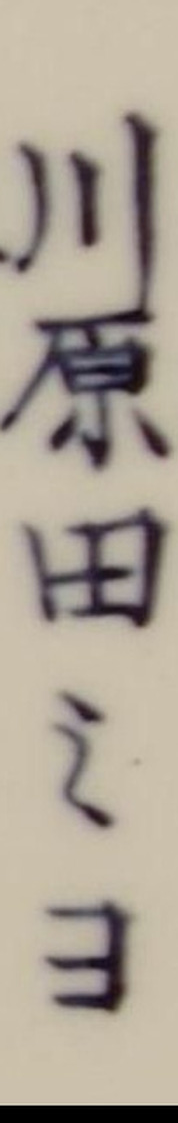川原田ミヨ
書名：E~L
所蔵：高野山金剛峯寺
